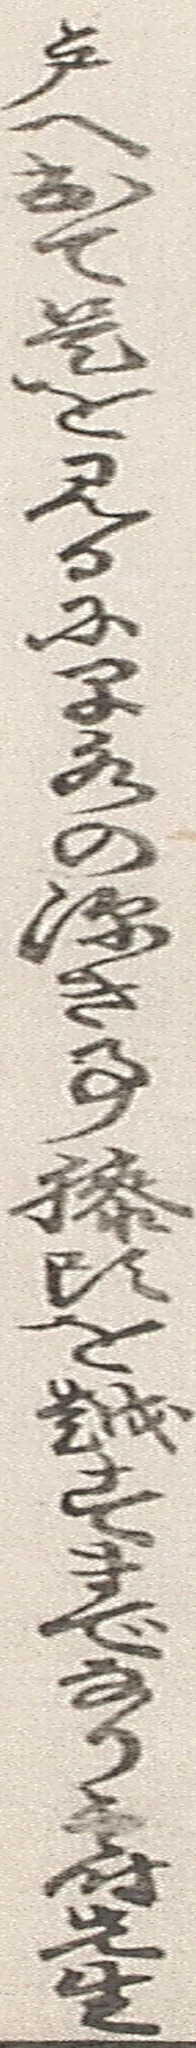戸へ出て是を見るに早水の深き事膝頭を越すまでなり其時先生
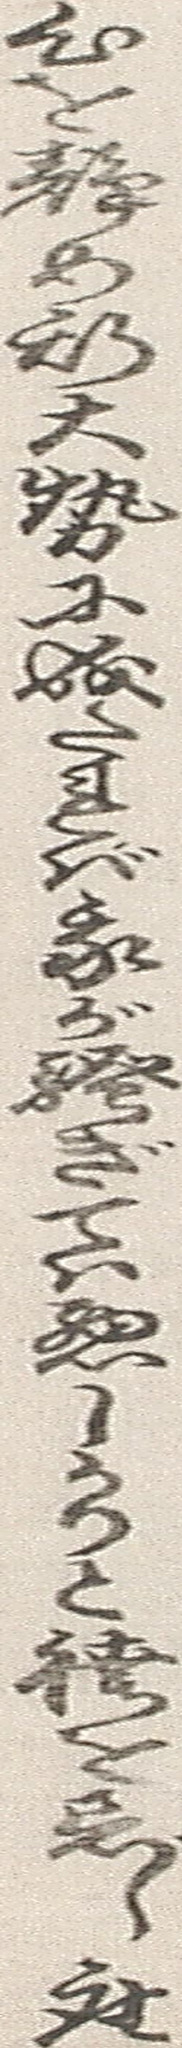心を静め斯大勢に成たれバ我が騒ぎてハ悪しかりと袴を着し座
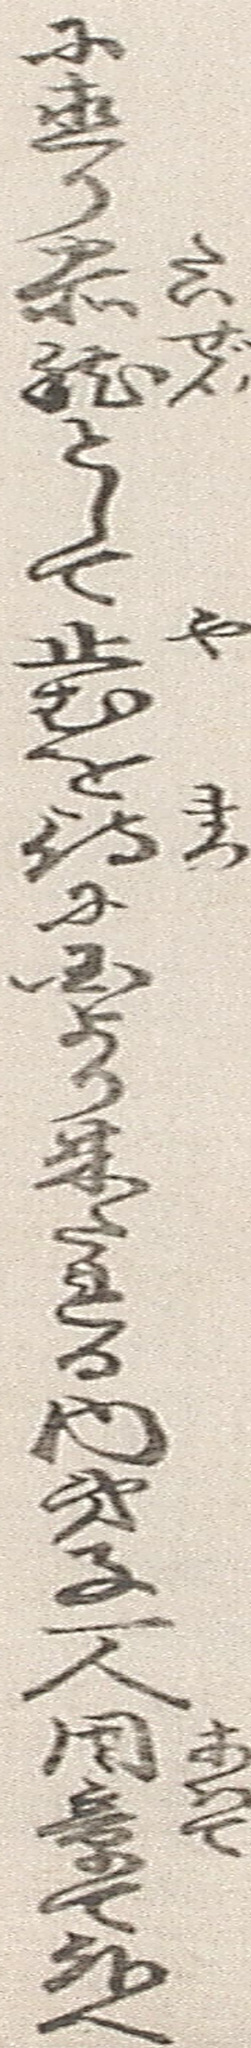に直り泰然として止むを待に国より来たれる内弟子一人周章て外へ
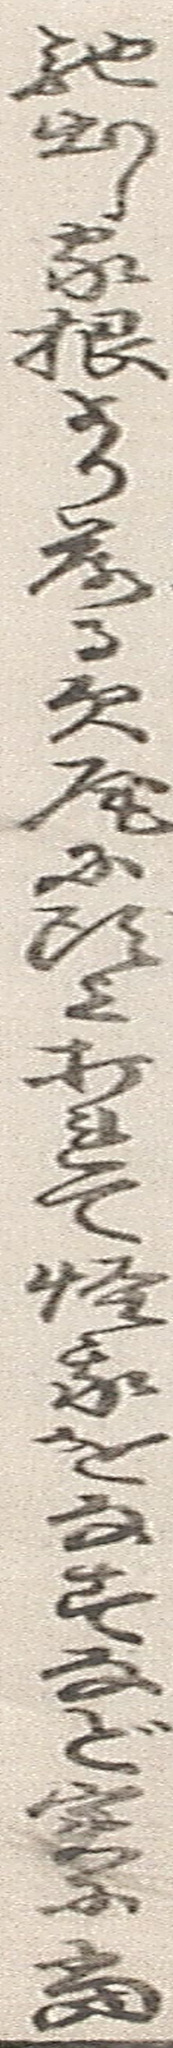馳出し家根より落る欠瓦に頭上打れて怪我を成すなど実に当
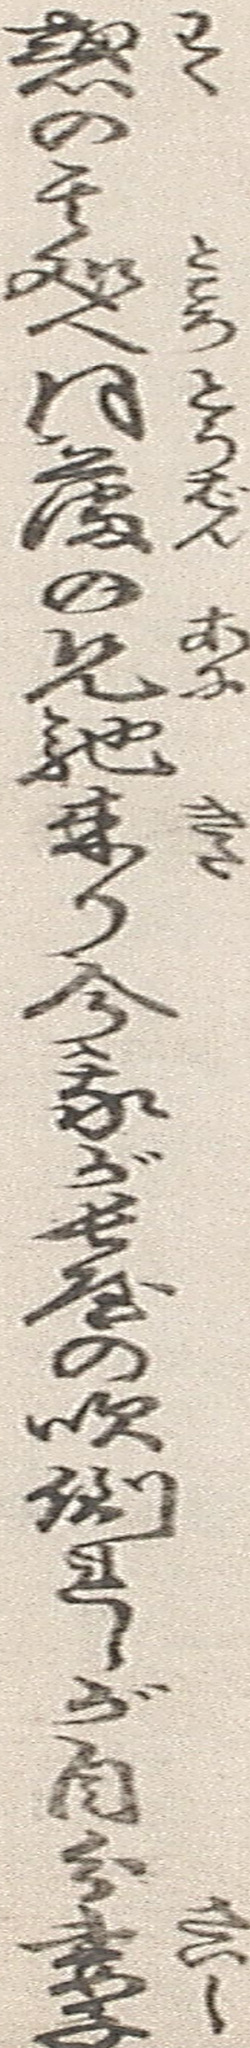惑の其処へ同藩の兄馳来り今我が長屋の吹倒れしが自分妻子
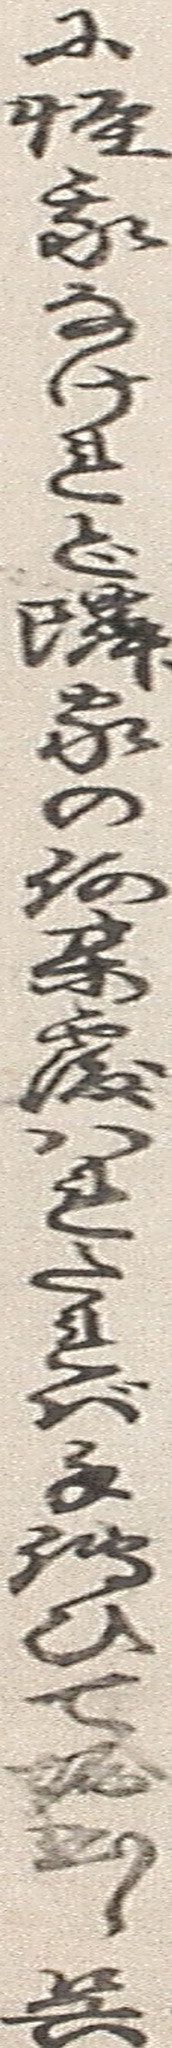に怪我なけれど隣家の何某覆はれバ手伝ひて堀出し呉
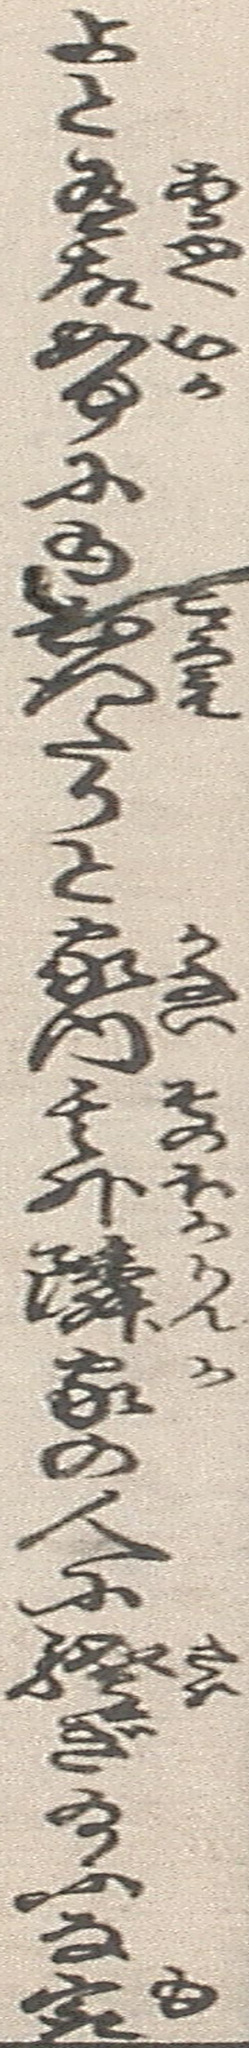よと有故如何にも心得たりと家内其外隣家の人に騒ぎ給ふな最
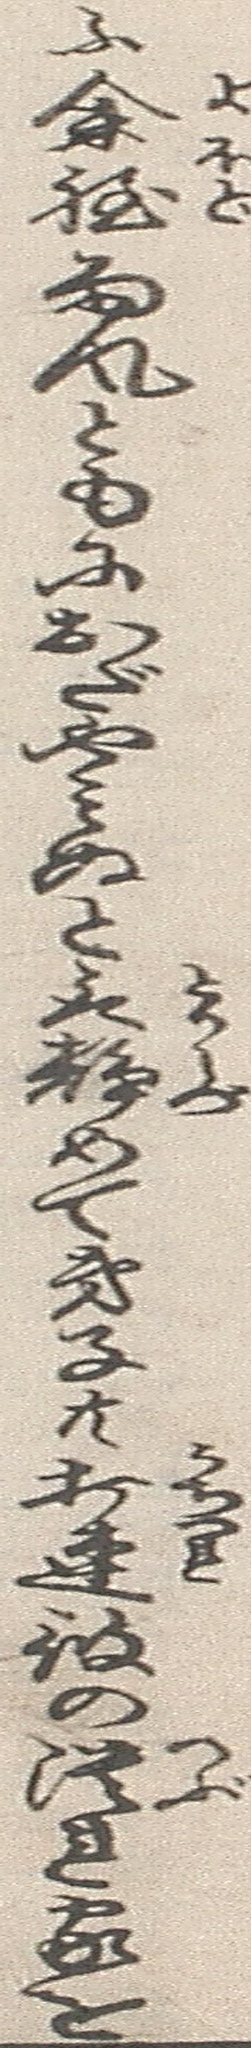ふ余程雨風ともにおだやミぬと取静めて弟子共打連彼の潰れ家を
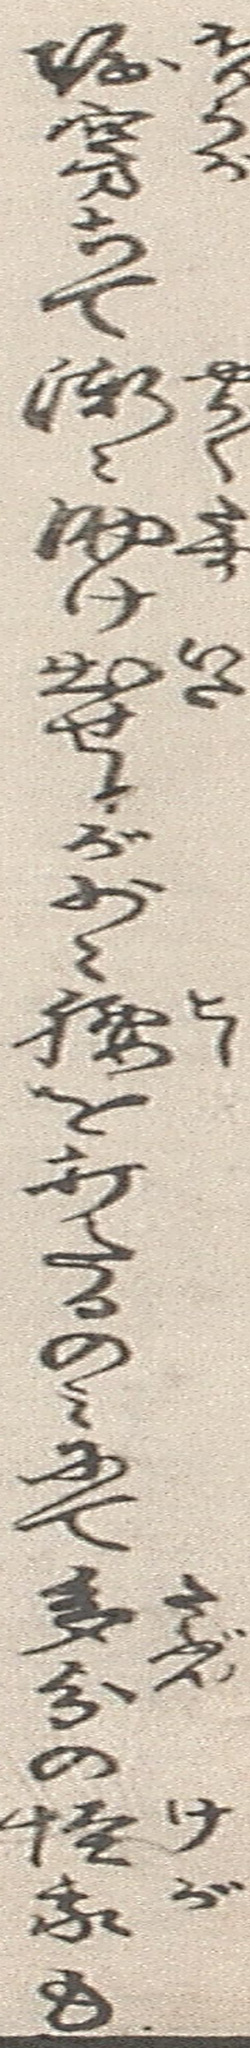掘穿ちて漸々助け出せしが少々腰を打たるのミにて多分の怪我も
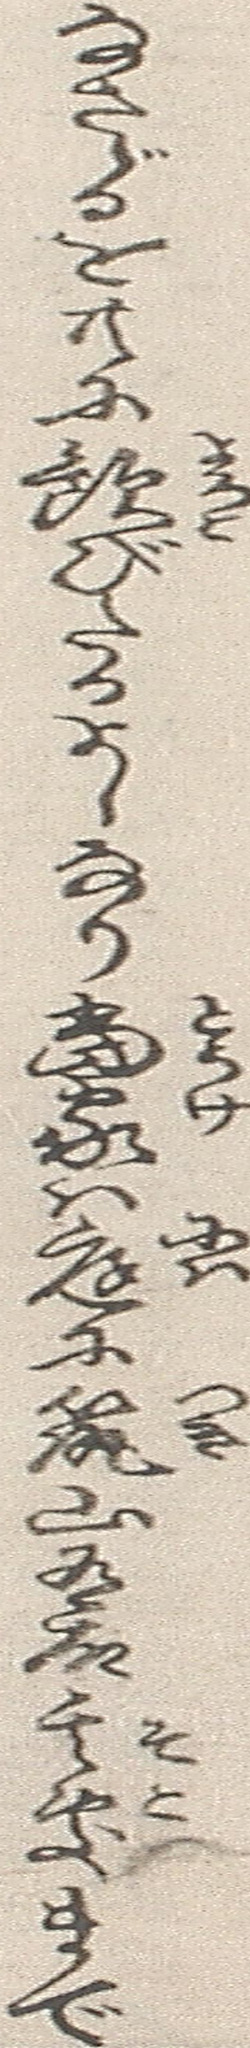なさゞるを共に歓びたるよしなり当家ハ庭に築山有故其処まで
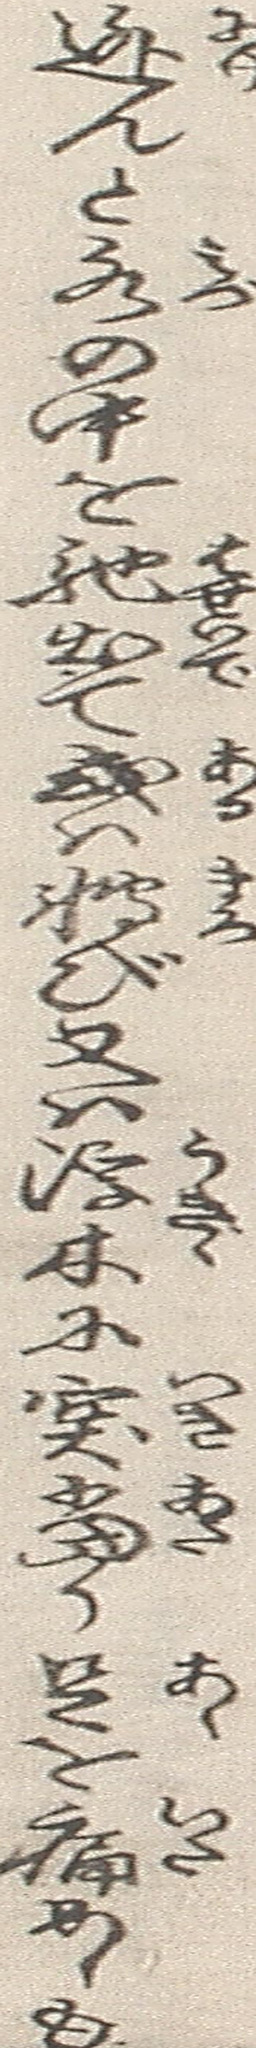逃んと水の中を馳出て或ハ転び又ハ浮木に突当り足を痛めしも
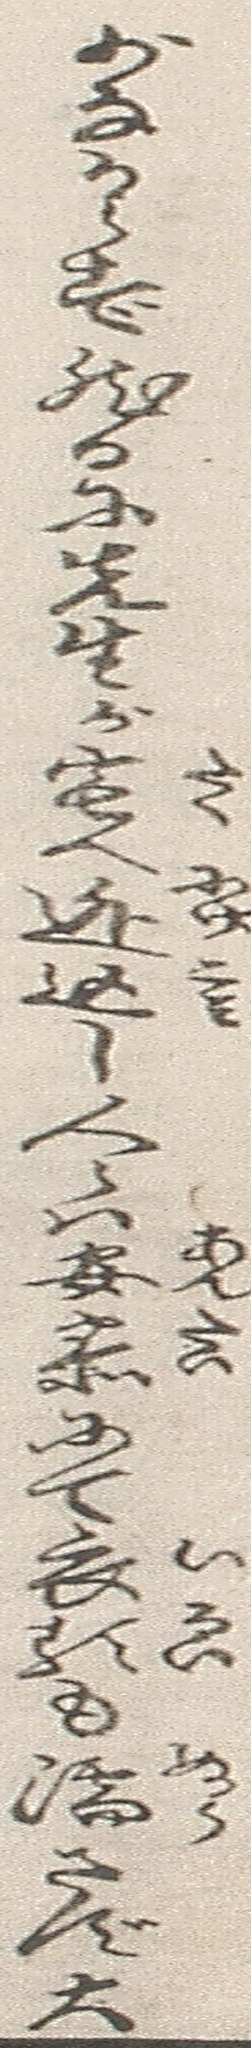少なからず然るに先生が宅へ逃込し人〻ハ安泰にて衣類も濡さず大
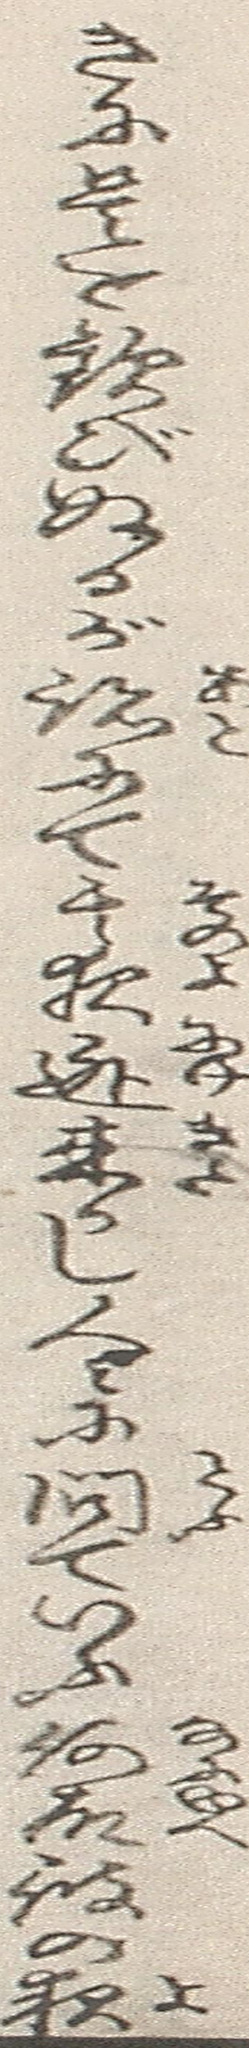きに是を歓びぬるが跡にて其夜逃来りし人々に問ていふ何故彼の夜
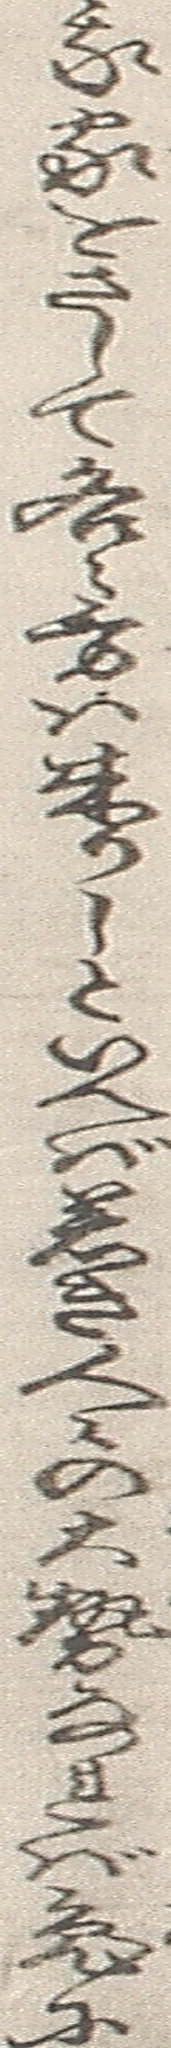我家をさして各々方ハ来たりしといへバ若き人々の大勢なれバ兎に
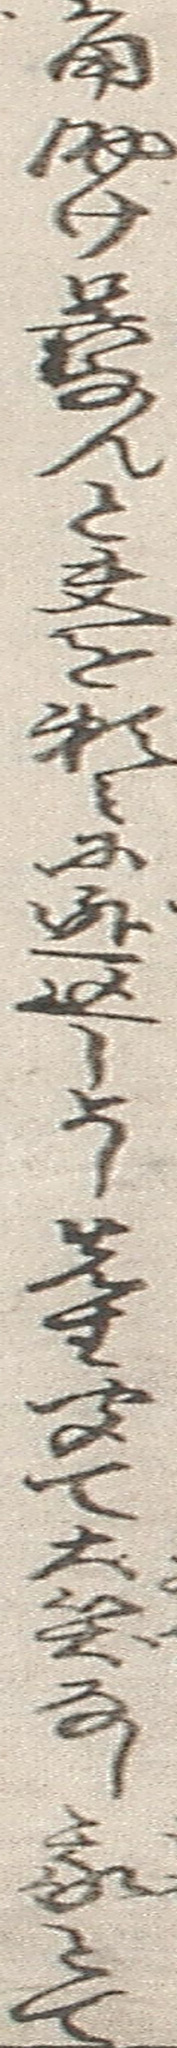角助け呉なんと夫を頼ミに逃込しよし先生聞て大笑なし我とて
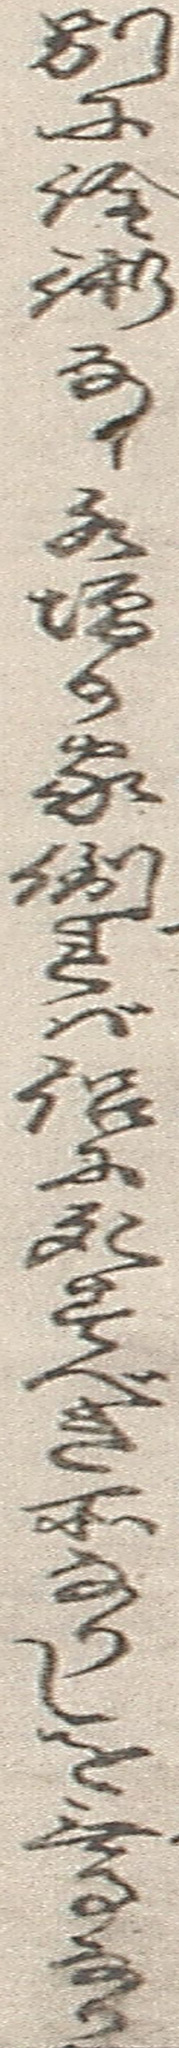別に詮術なし水増り家倒れバ供に死すべき所なりしを無事なり
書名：安政風聞集　上中下　全
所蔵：東京大学地震研究所図書室 Earthquake Research Institute Library, The University of Tokyo, JAPAN
